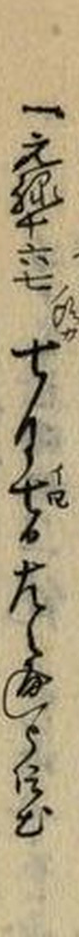一元禄十六七頃カ七月七日左之通被仰出
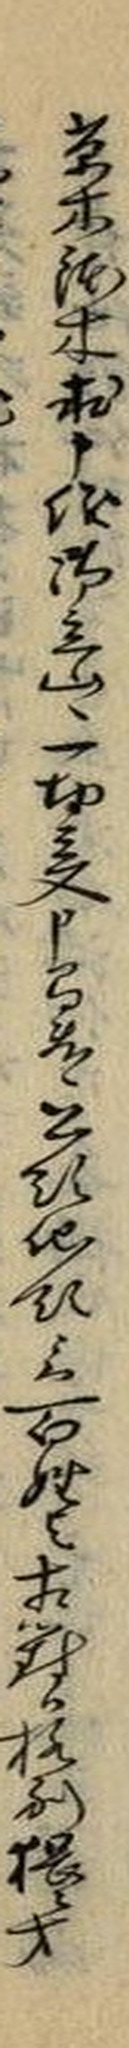草木鉢木求申儀御立山へ一切立入申間敷候公領他領ニ而百姓与相対ハ格別猥ニ才
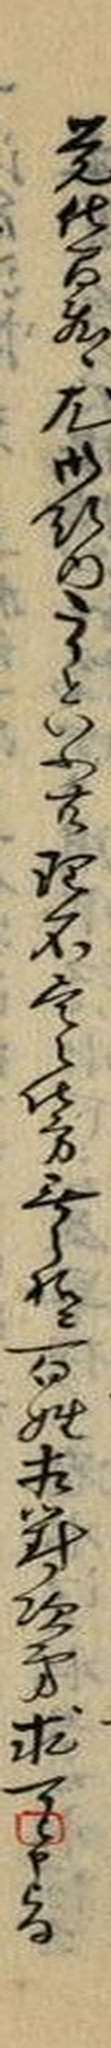覚仕間敷候尤御領内たりといふ共理不尽之仕方無之様ニ百姓相対次第求可被申旨
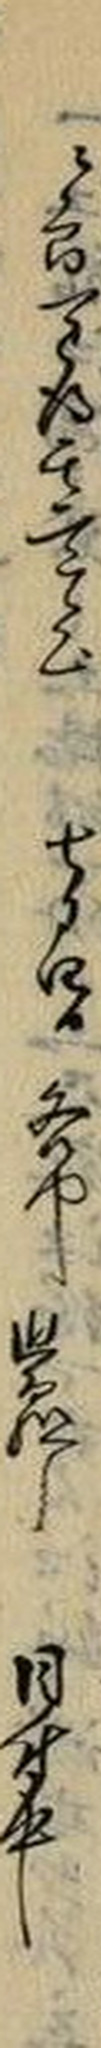ニ候間可被得其意候已上七月四日各中追而組目付中
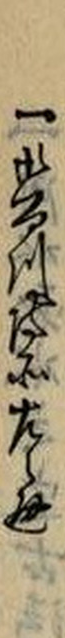一御留川場所左之通
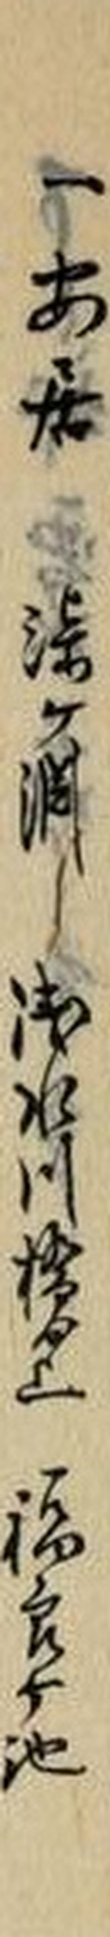一安居漆ケ淵浅水川橋ゟ上福良ケ池
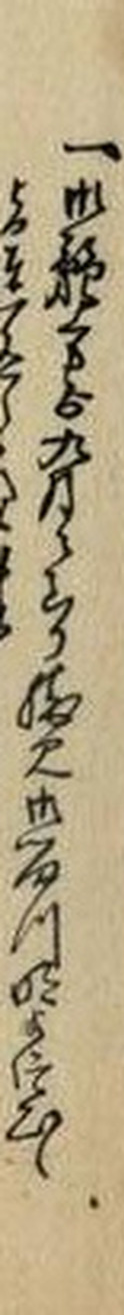一御鵜方ゟ九月ニ至り勝見御留川明被仰付候
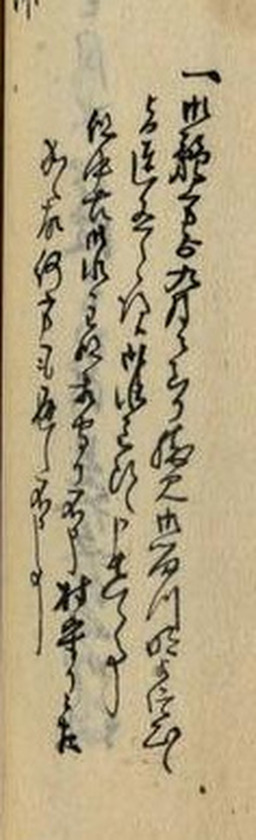旨達有之候得ハ御水主頭へ申遣候事
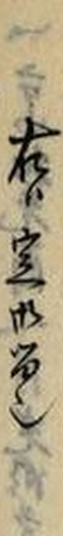右ハ定御留也
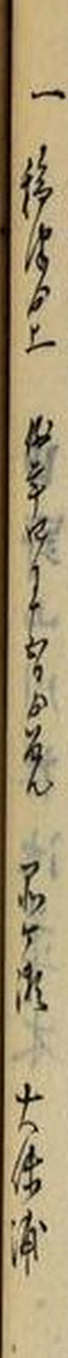一稲津ゟ上例年四月十五日ゟ留ル品ケ瀬大味浦
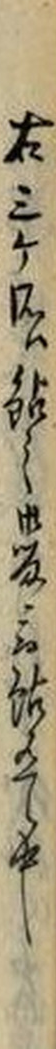右三ケ所ハ鮎之御留ニ而鮎有之中
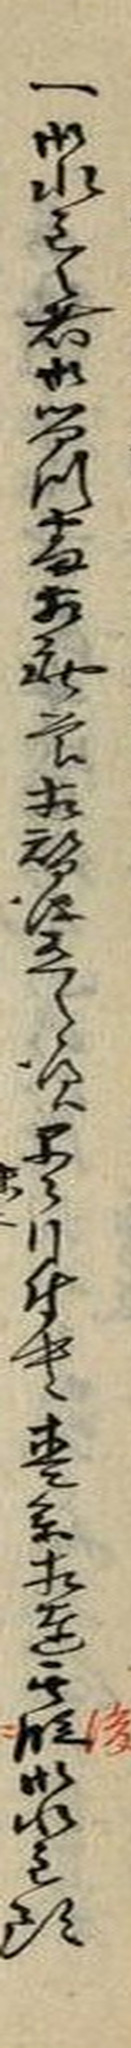一御水主之者御留川番相勤候節相替儀有之候得ハ早々目付中へ直ニ参相達其段御水主頭
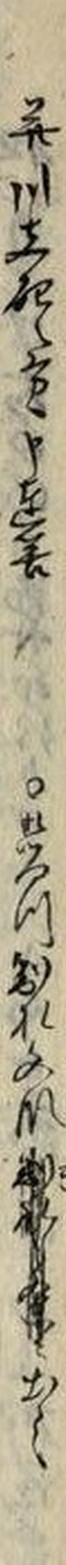幷川支配之方へ申達筈〇御留川制札文段末ニ出之
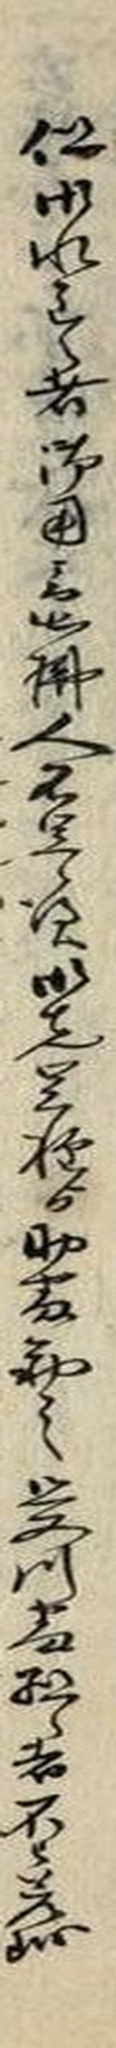但御水主之者御用ニ而出掛人不足候得ハ御先足軽ゟ助番勤之且又川番組之者不被差越
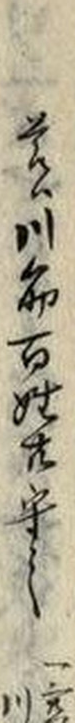節ハ川筋百姓共守之
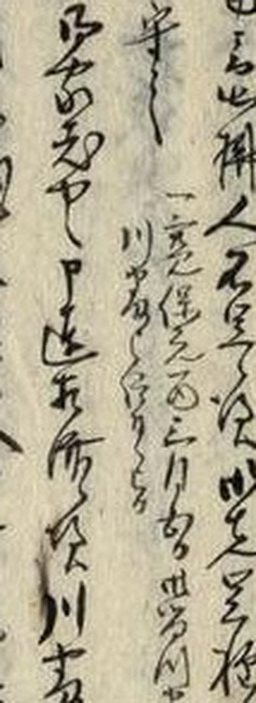川番被仰付候旨
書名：御国他国諸事之部
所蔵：福井県文書館 Fukui Prefectural Archives
